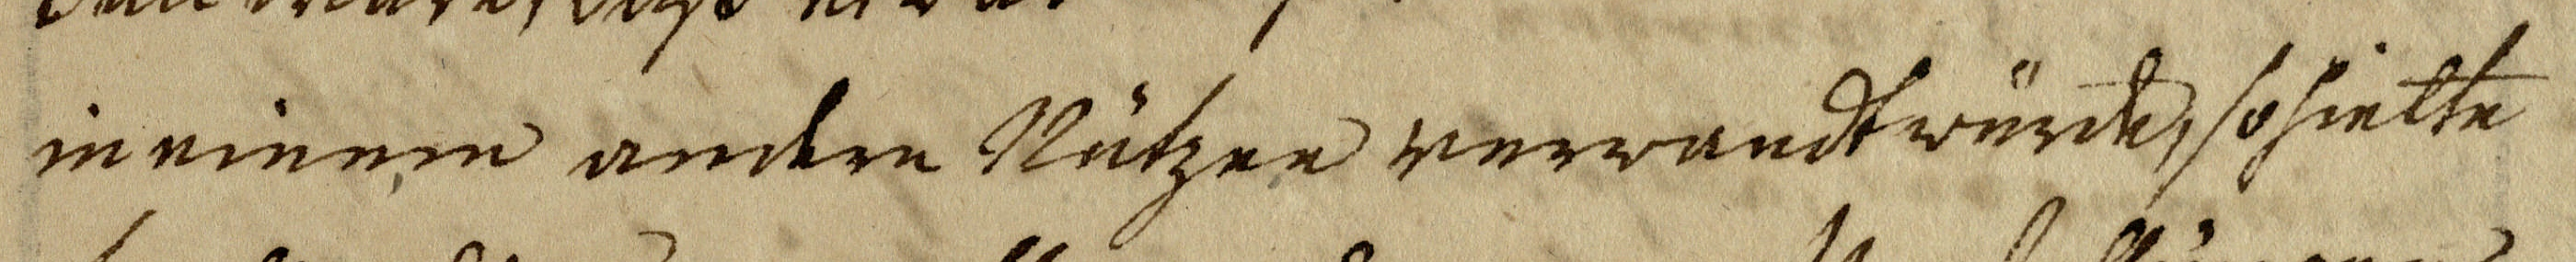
in einem andern Nutzen verwandt würde, so hielte
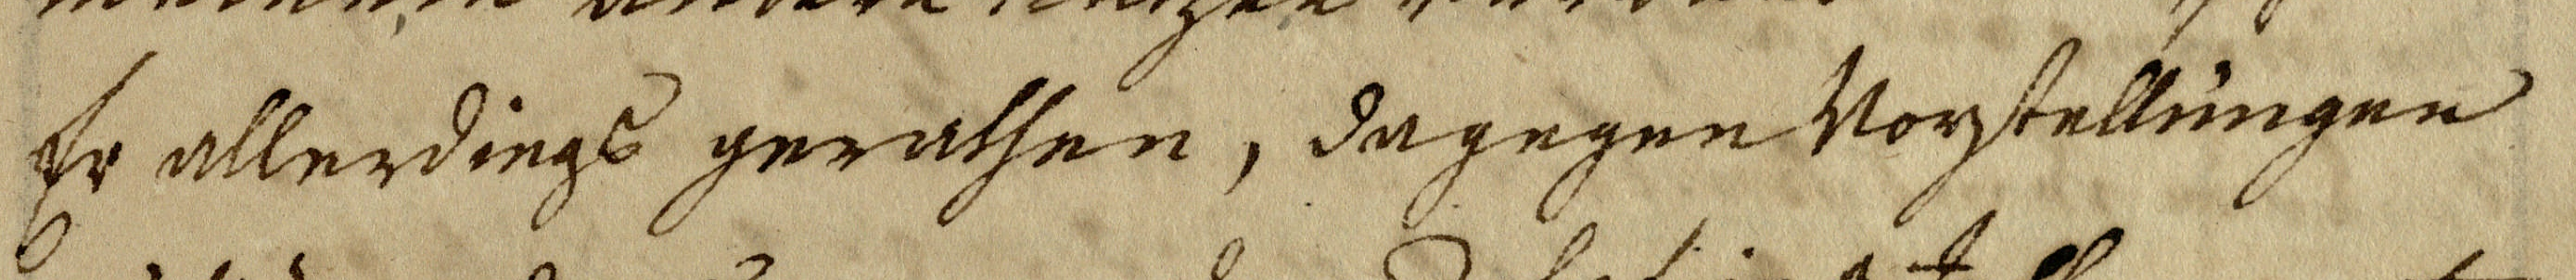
Er allerdings gerathen, dagegen Vorstellungen
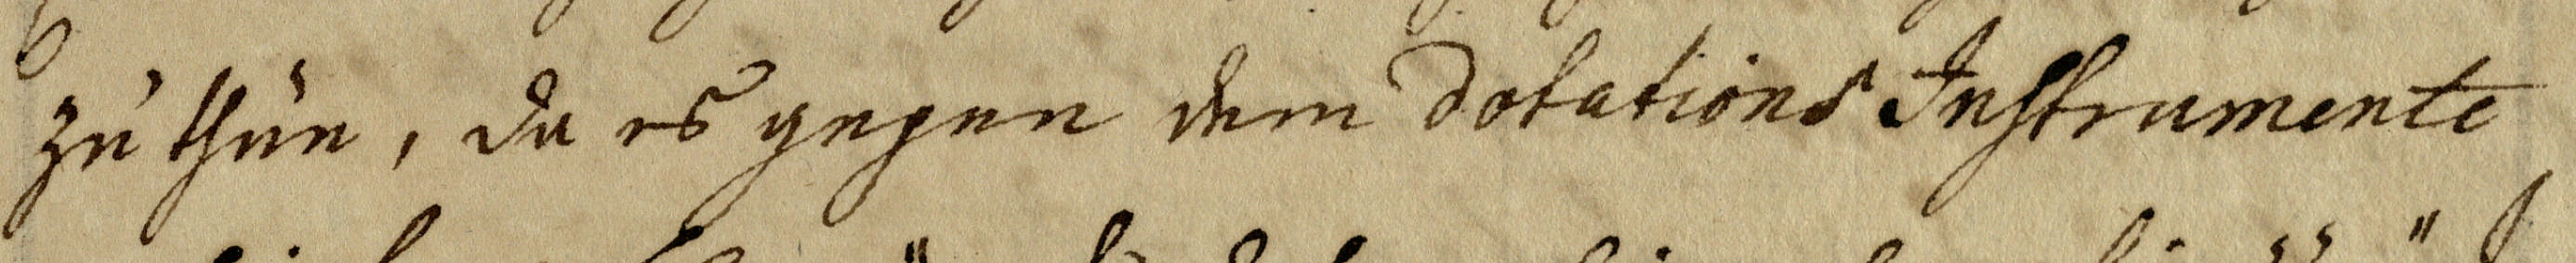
zu thun, da es gegen dem dotations Instrumente
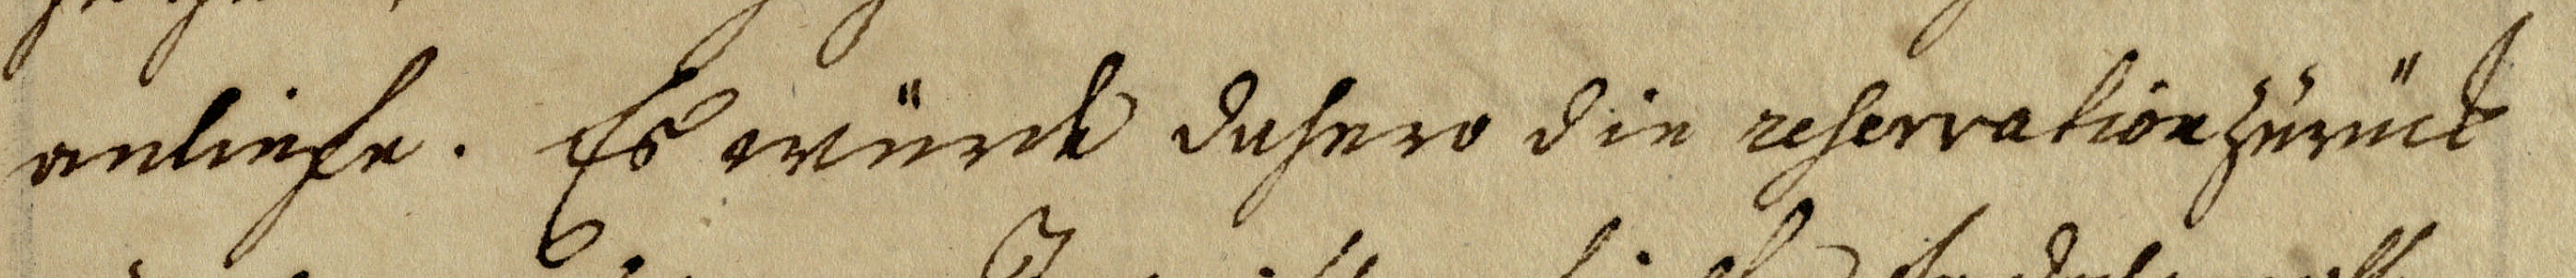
anliefe. Es würde dahero die reservation zurück
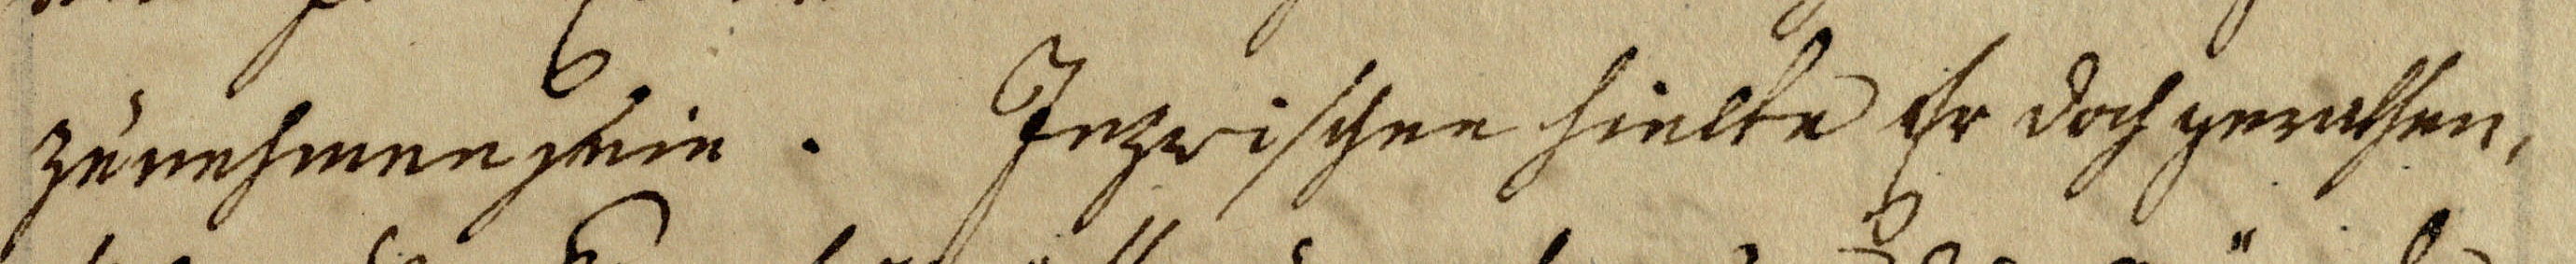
zu nehmen sein. Inzwischen hielte Er doch gerathen,
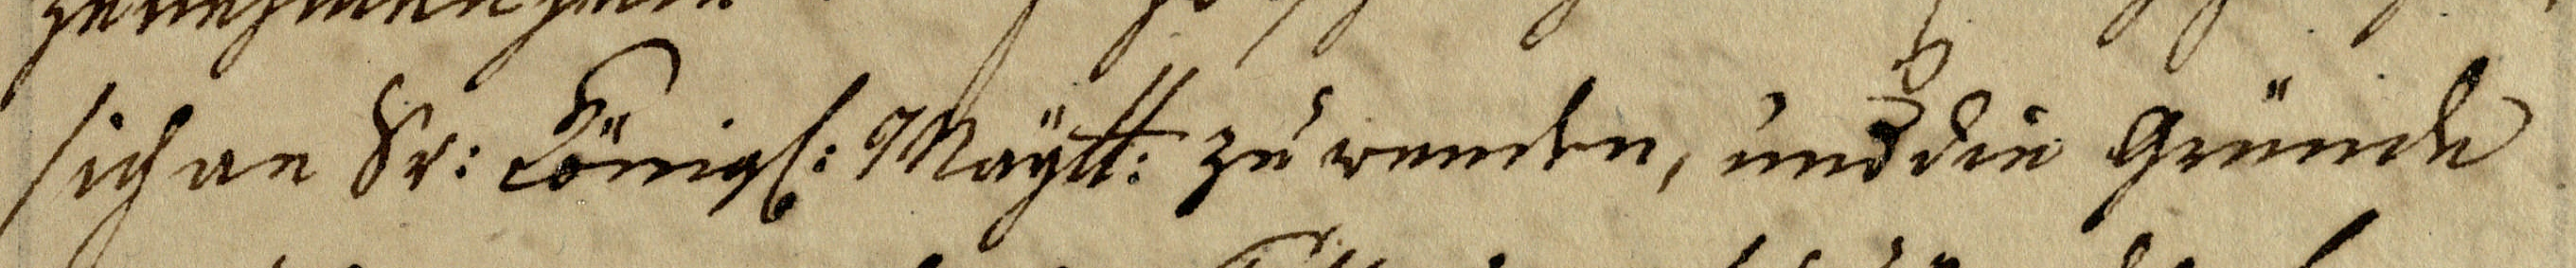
sich an Sr. Königl. Maÿtt zu wenden, und die Gründe
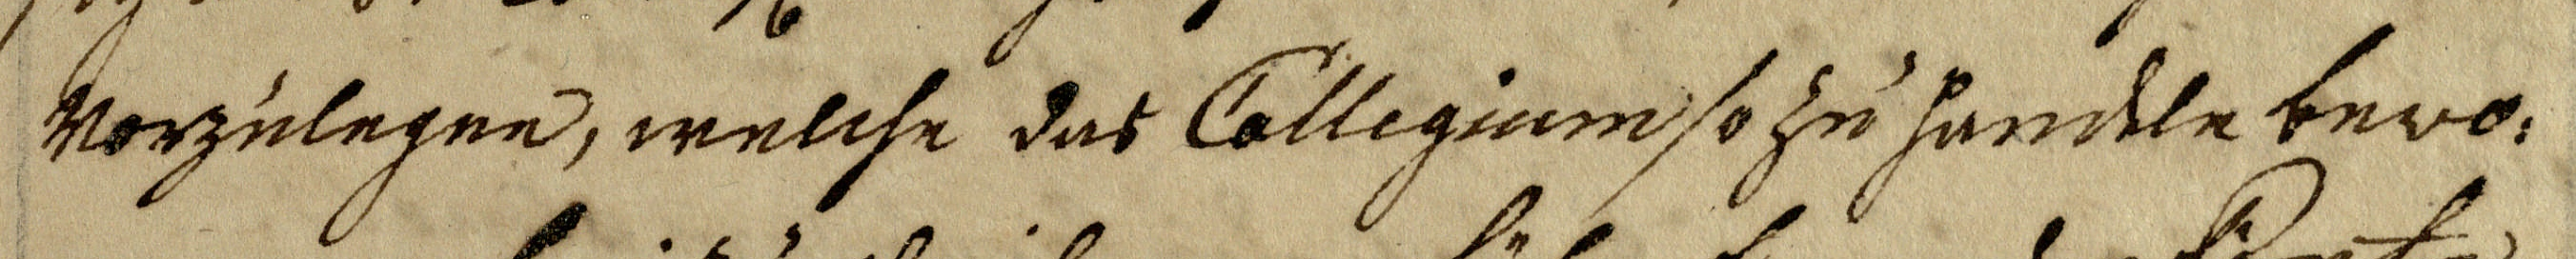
vorzulegen, welche das Collegium so zu handeln bewo¬
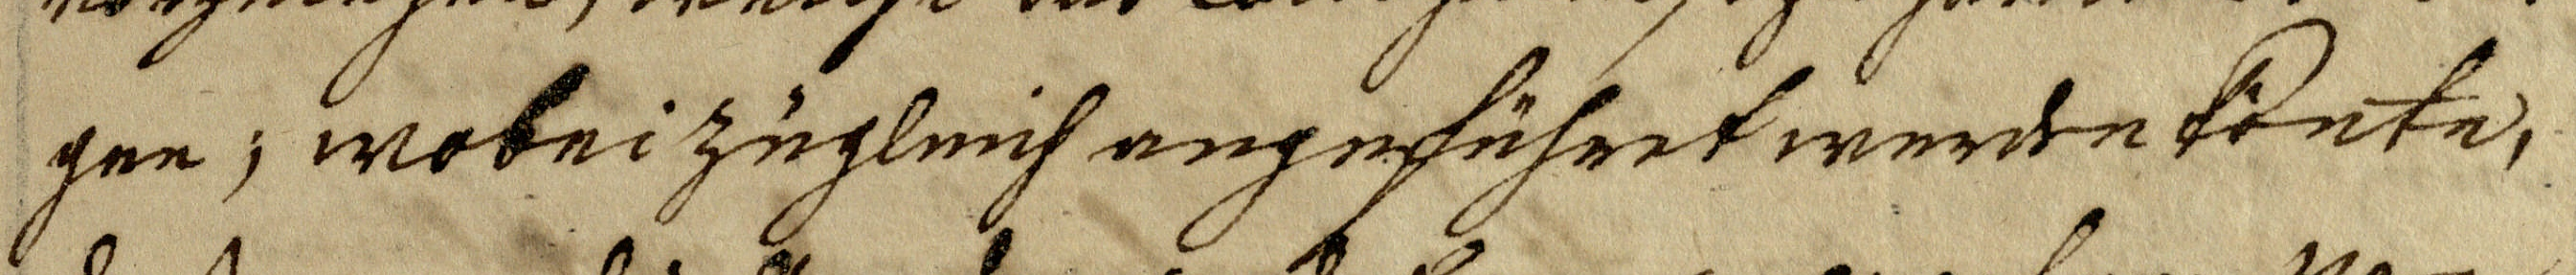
gen; wobei zugleich angeführet werden könte,
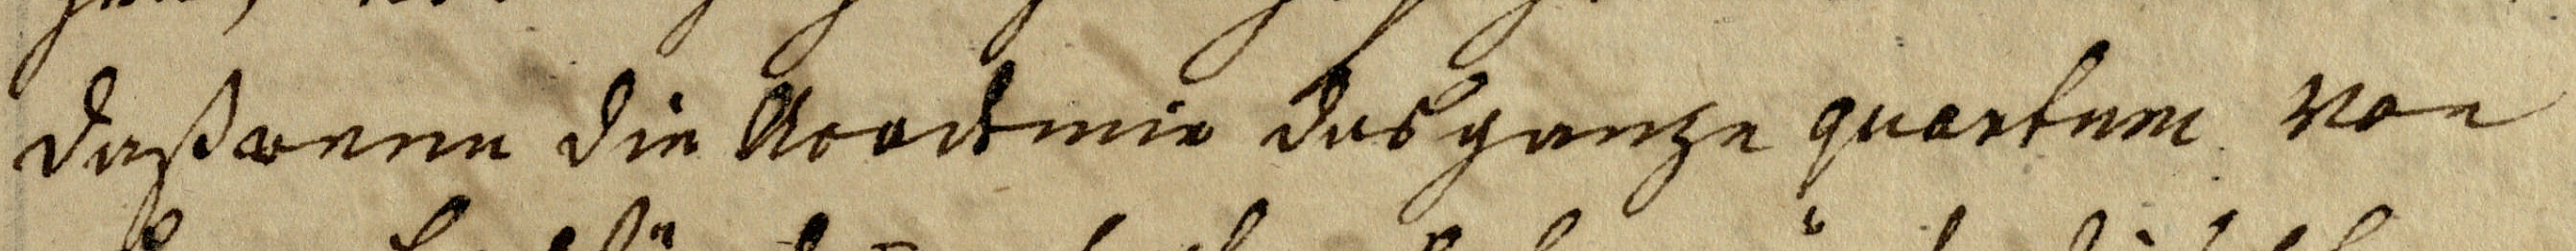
daß wenn die Academie dasgauze Quantum von
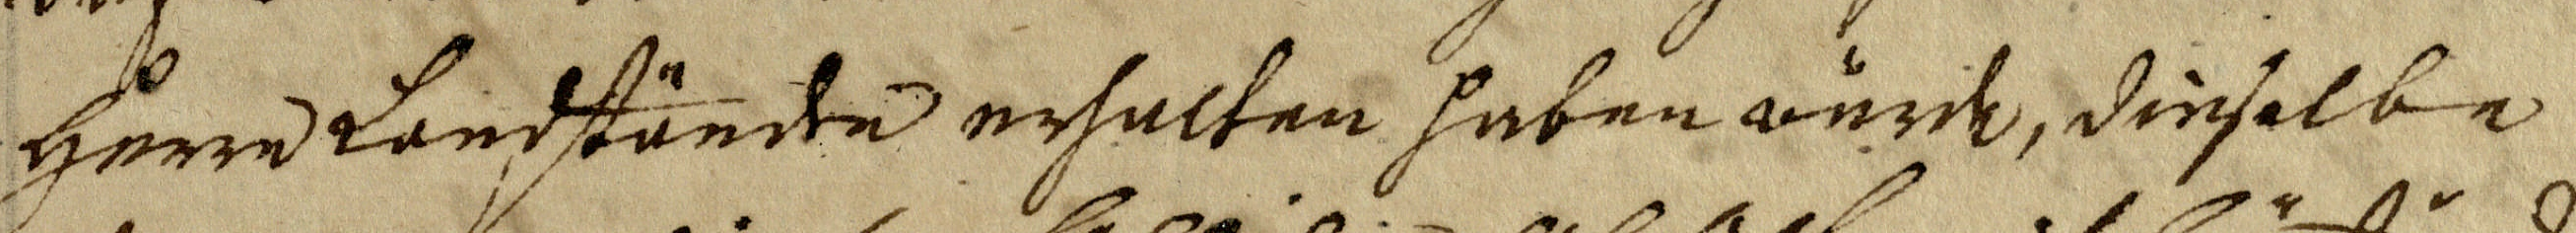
Herrn Landständen erhalten haben würde, dieselbe
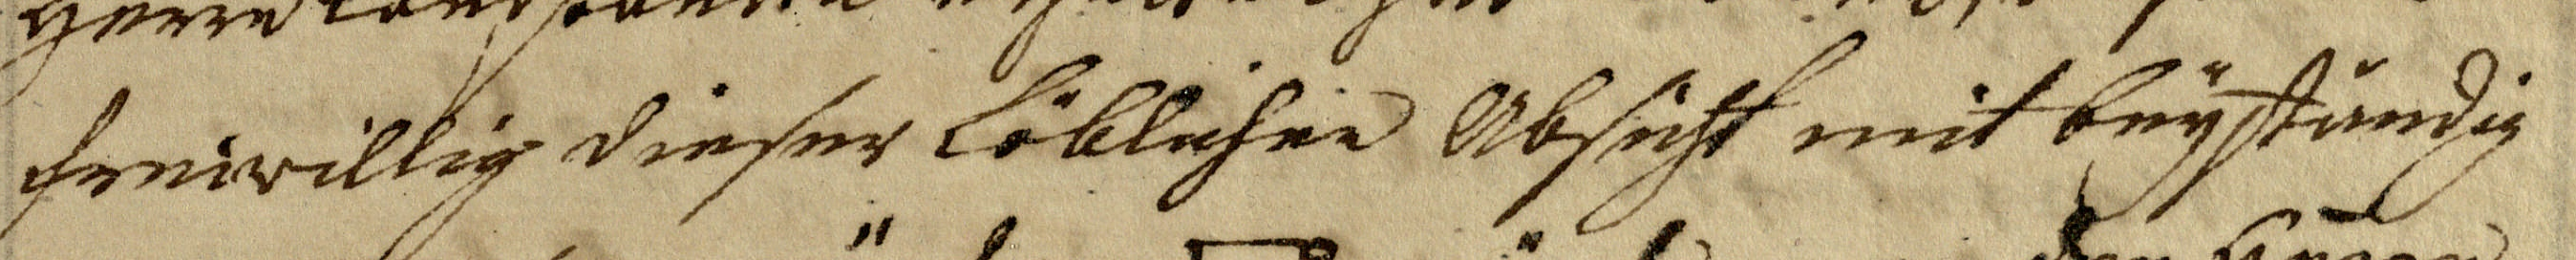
freiwillig dieser Löblichen Absicht mit beÿständig
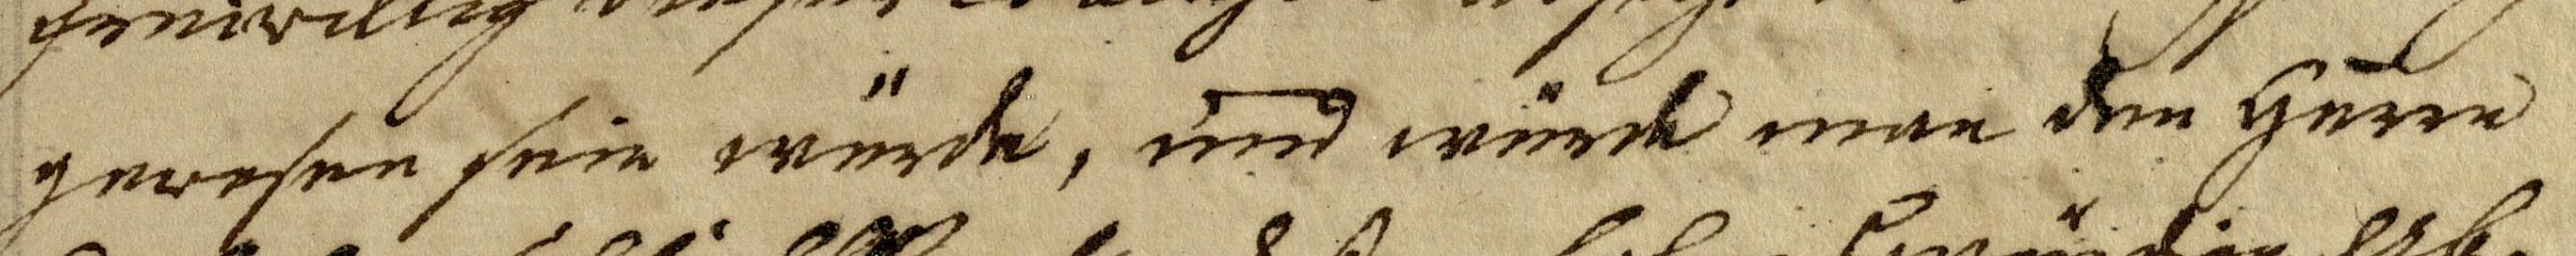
gewesen sein würde, und würde man dem Herrn
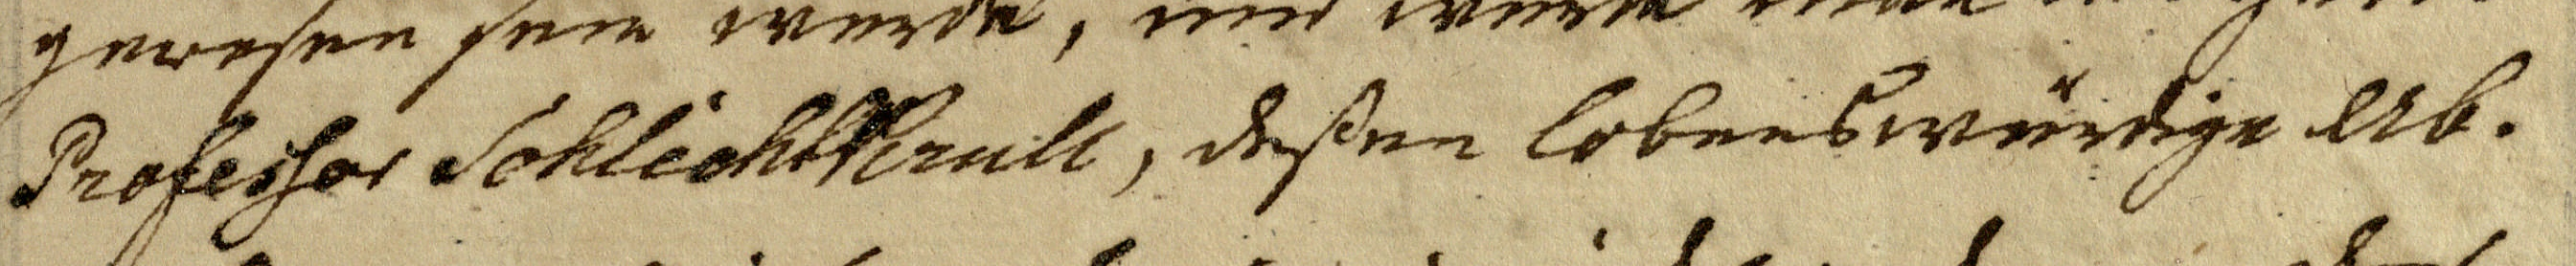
Professor Schlichtkrull, deßen lobenswürdige Ab¬
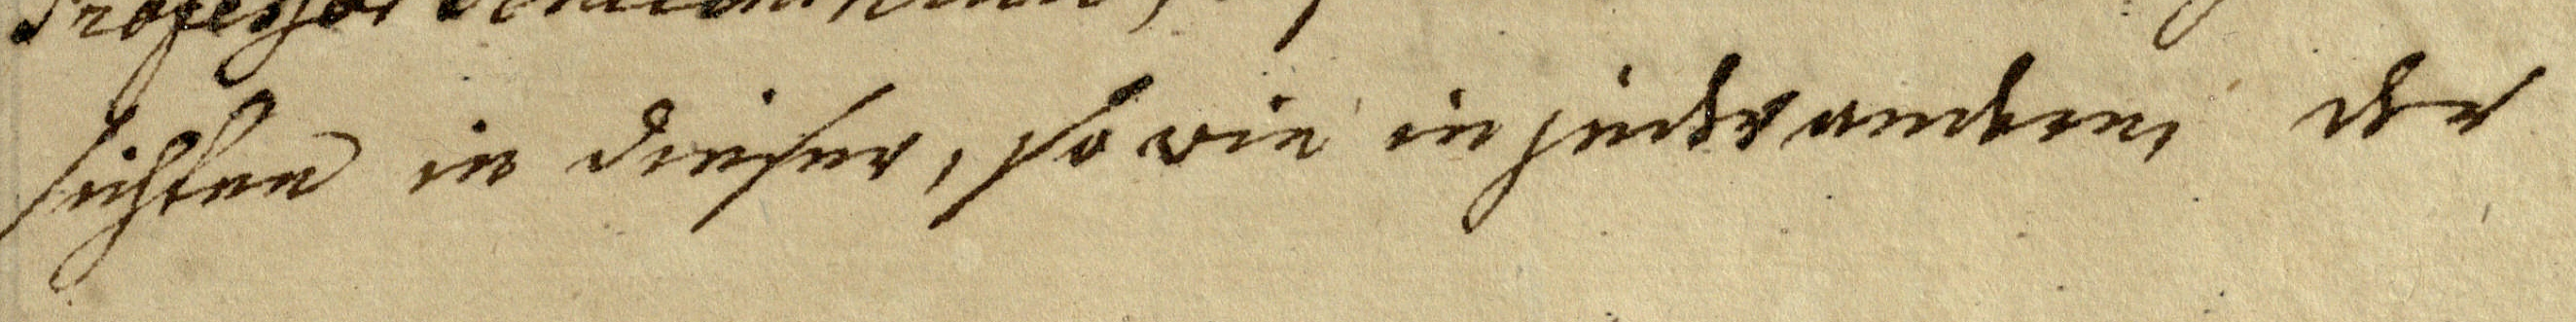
sichten in dieser, so wie in jeder andern, der
